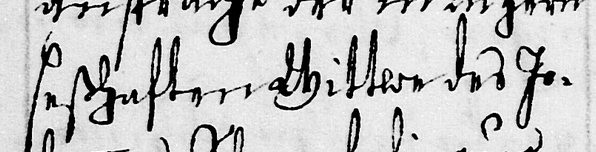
seßhaften Wittwe des Jo¬
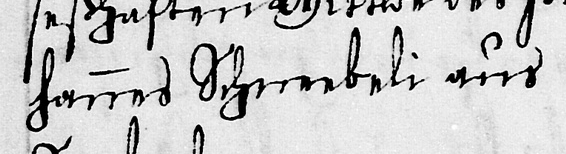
hannes Schneebeli aus
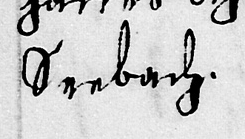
Seebach,
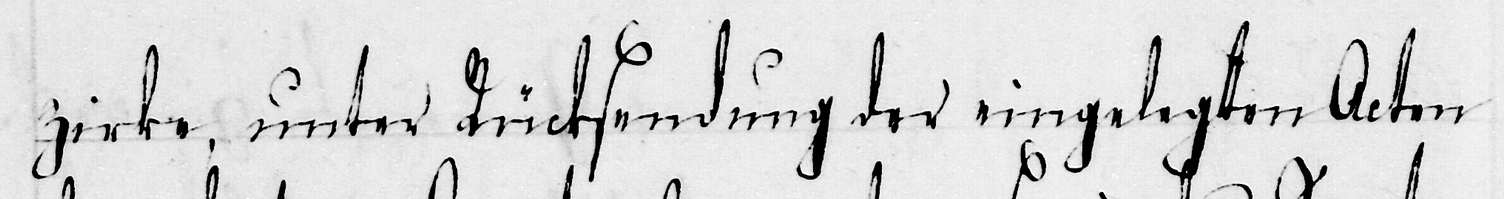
zirke, unter Rücksendung der eingelegten Acten
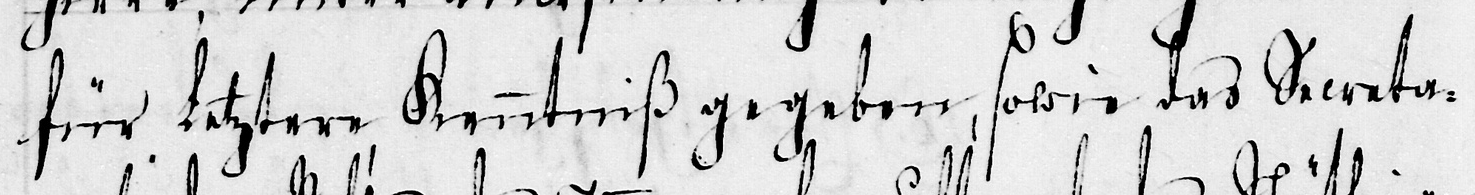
für Letztere Kenntniß gegeben, sowie das Secreta¬
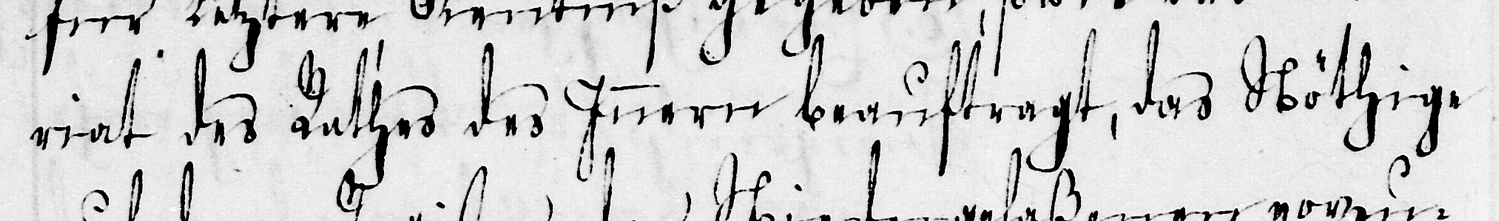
riat des Rathes des Innern beauftragt, das Nöthige
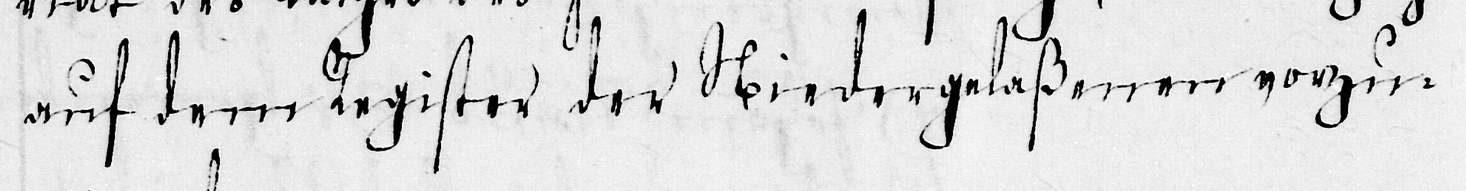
auf dem Register der Niedergelaßenen vorzu¬
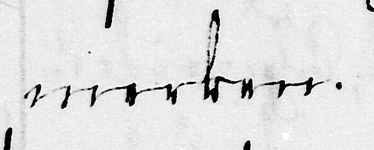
merken.
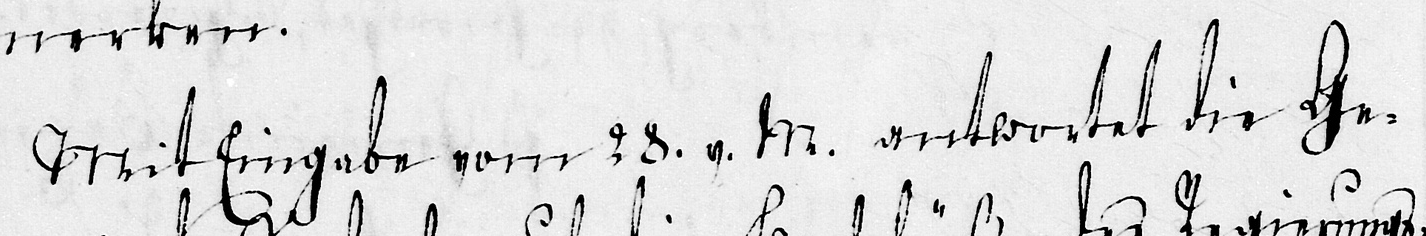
Mit Eingabe vom 28. v. M. antwortet die Ge¬
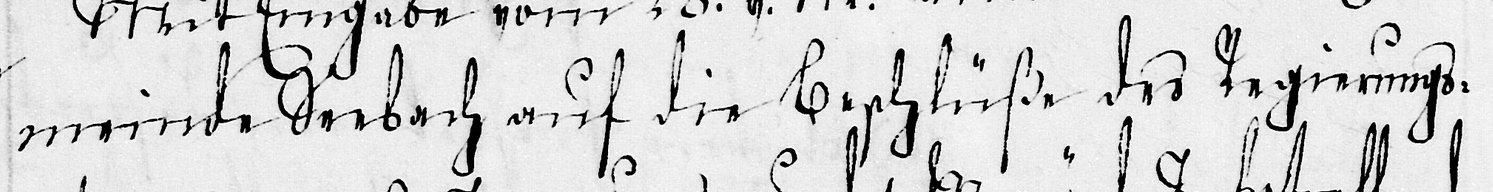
meinde Seebach auf die Beschlüße des Regierungs¬
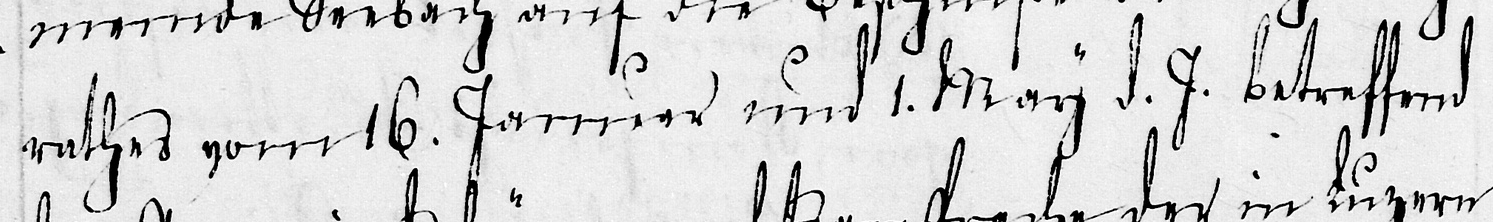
rathes vom 16. Januar und 1. May d. J. betreffend
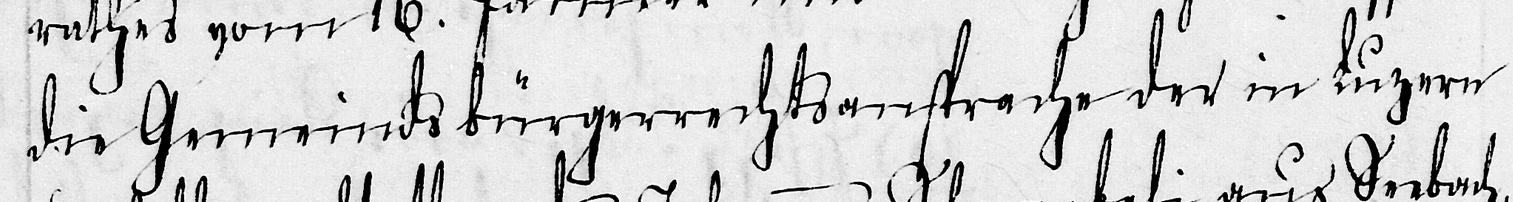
die Gemeindsbürgerrechtsansprache der in Luzern
